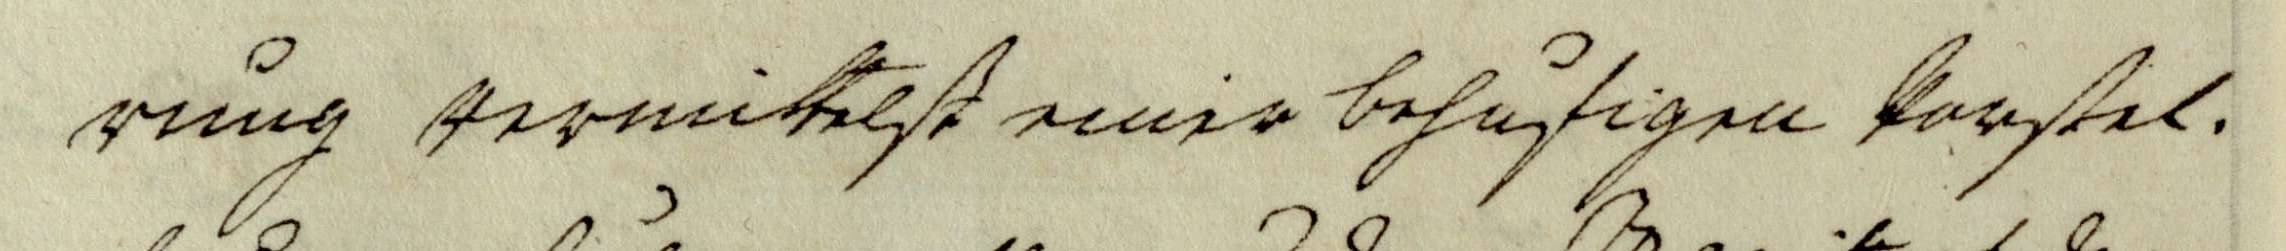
rung vermittelst einer behufigen Vorstel¬
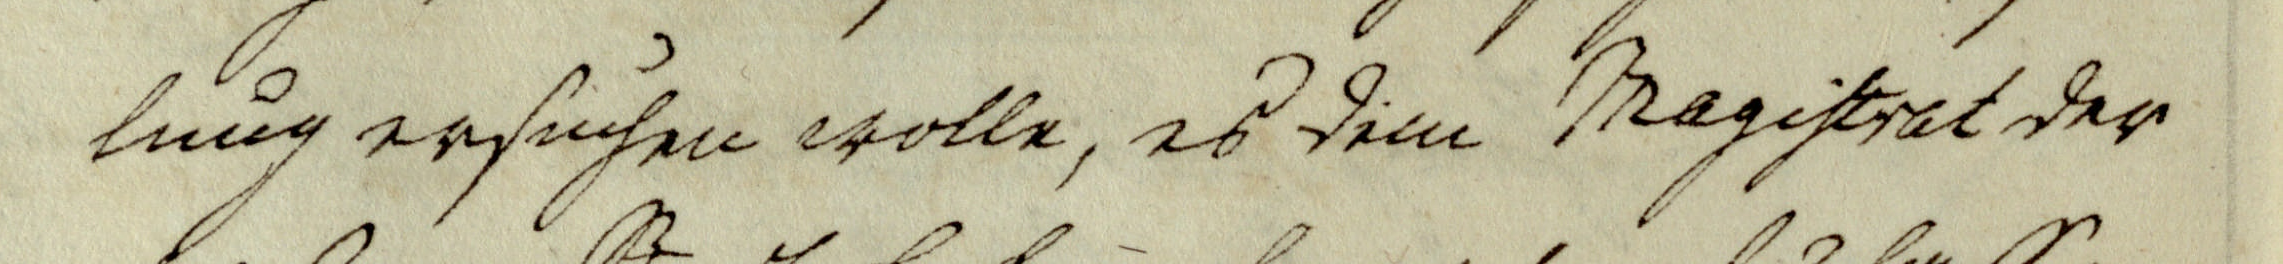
lung ersuchen wolle, es dem Magistrat der
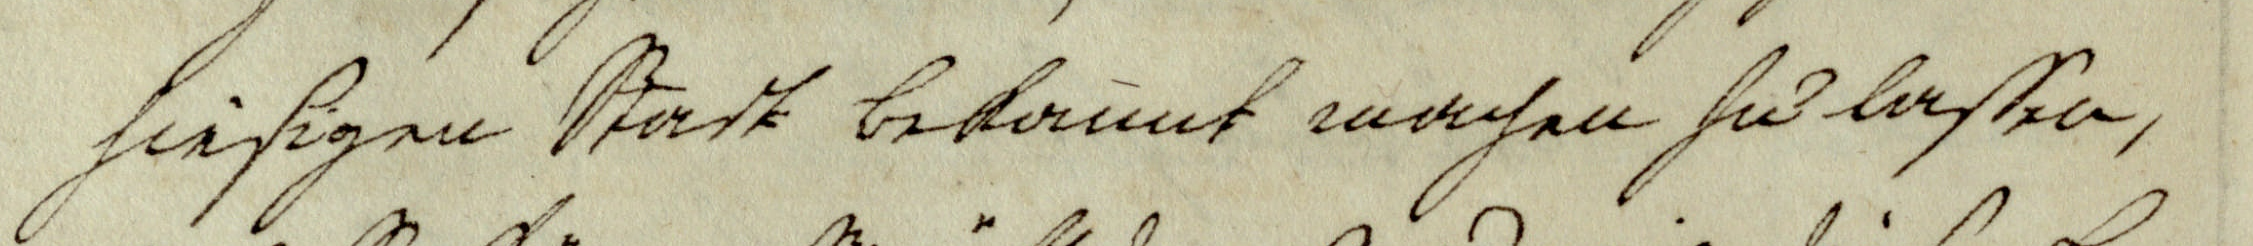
hiesigen Stadt bekannt machen zu lassen,
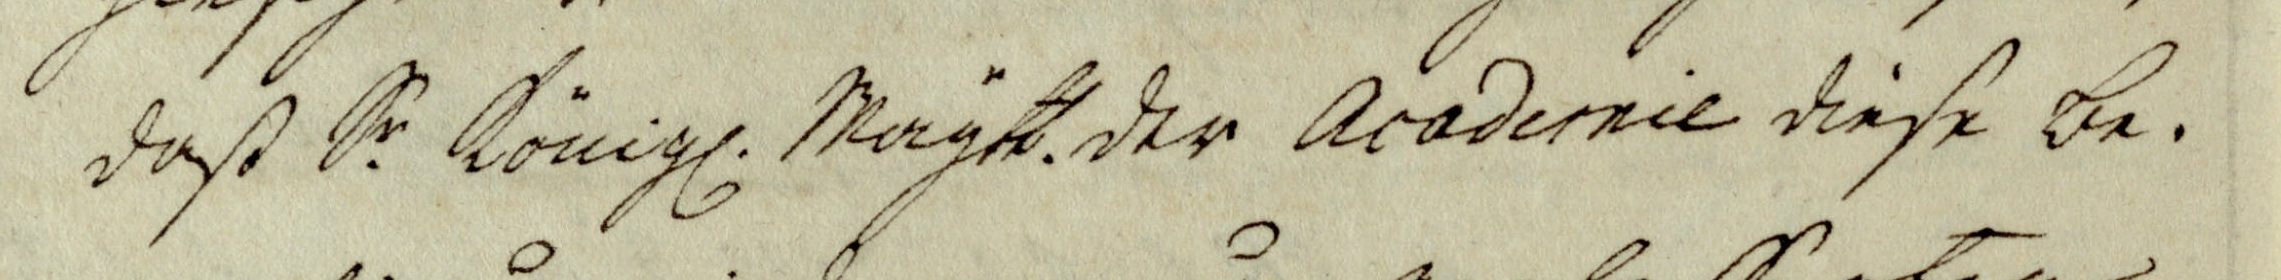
daß Sr Königl. Maÿtt. der Academie diese Be¬
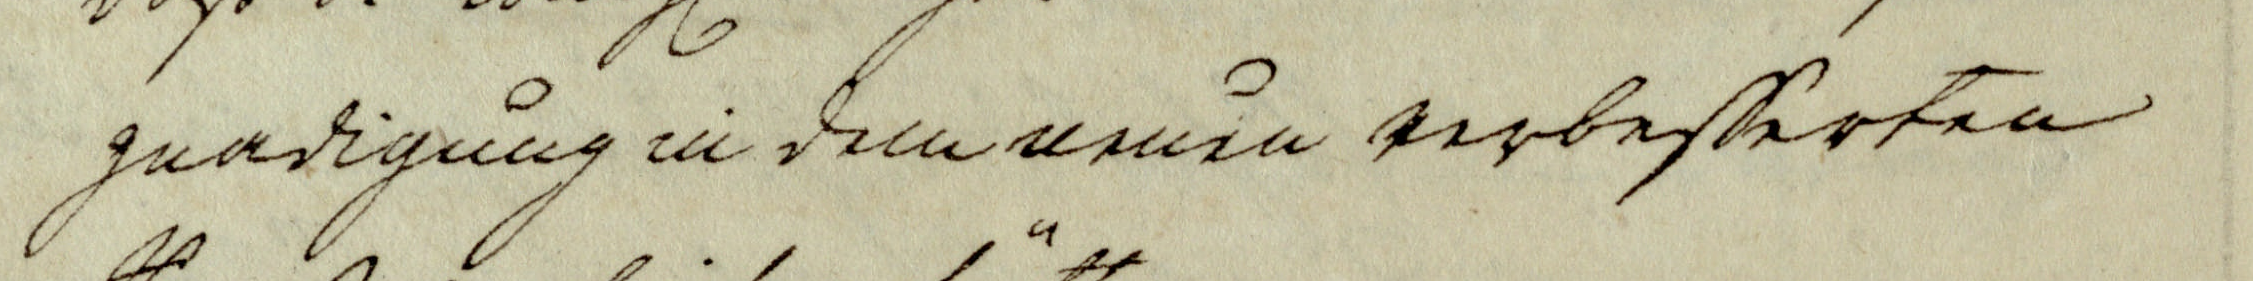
gnadigung in dem neuen verbesserten
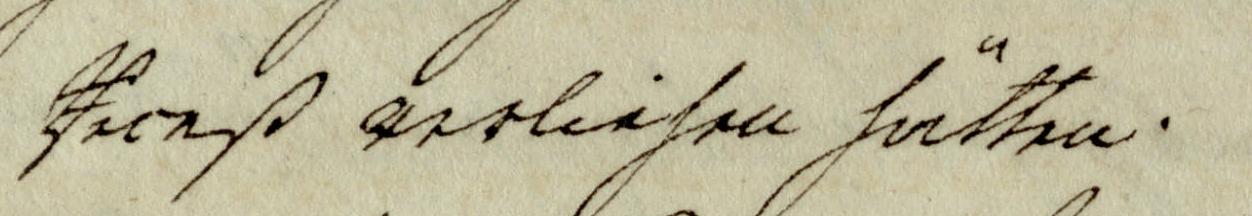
Receß verliehen hätten.
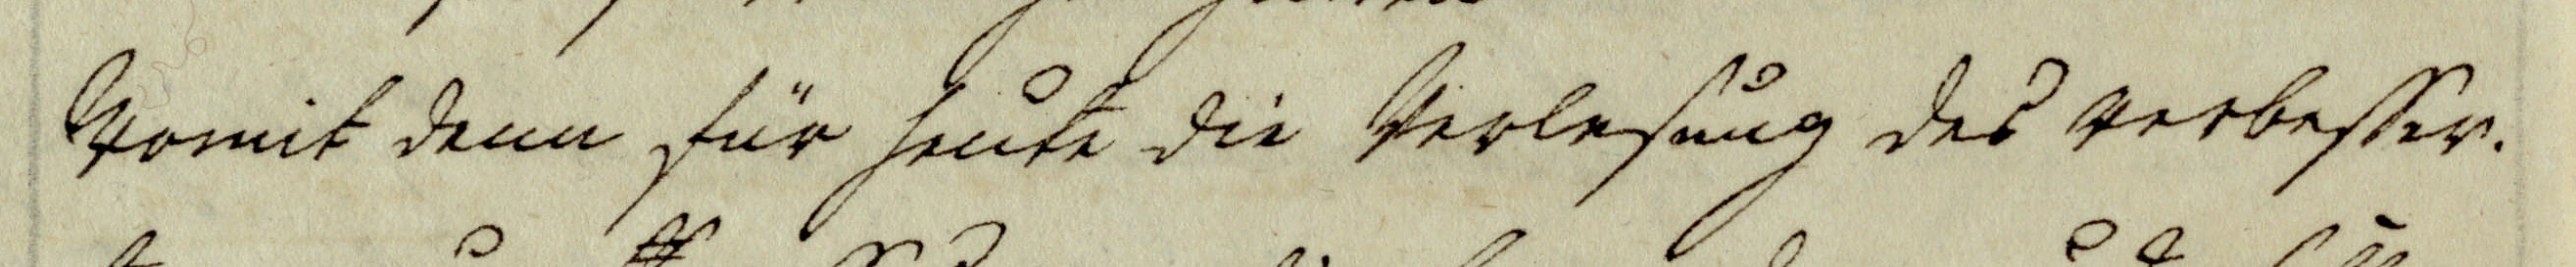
Womit denn für heute die Verlesung des verbesser¬
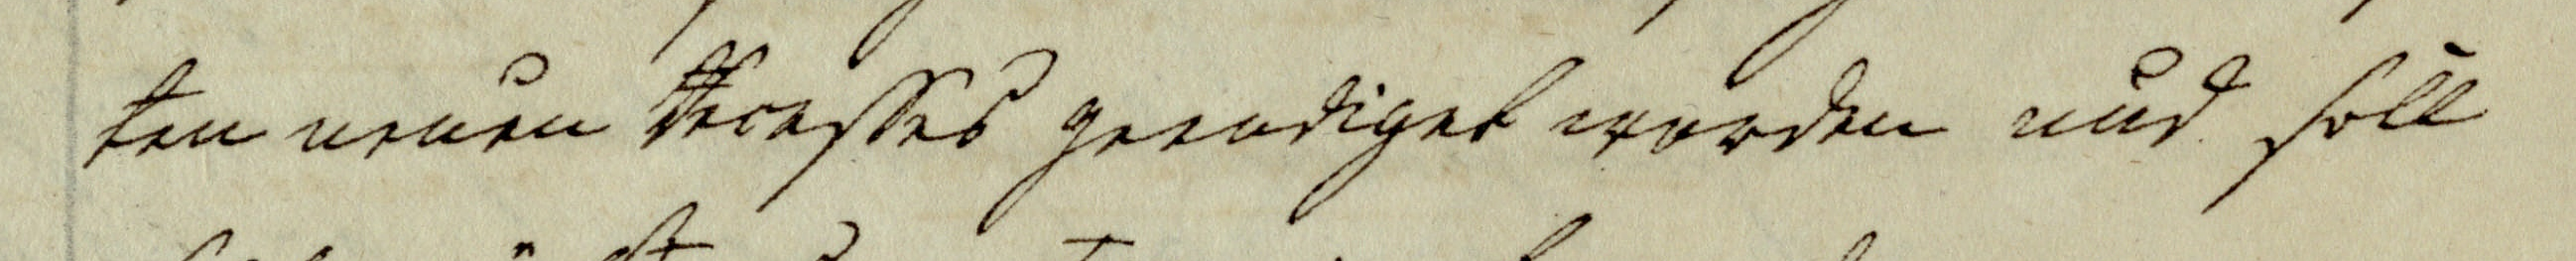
ten neuen Recesses geendiget worden und soll
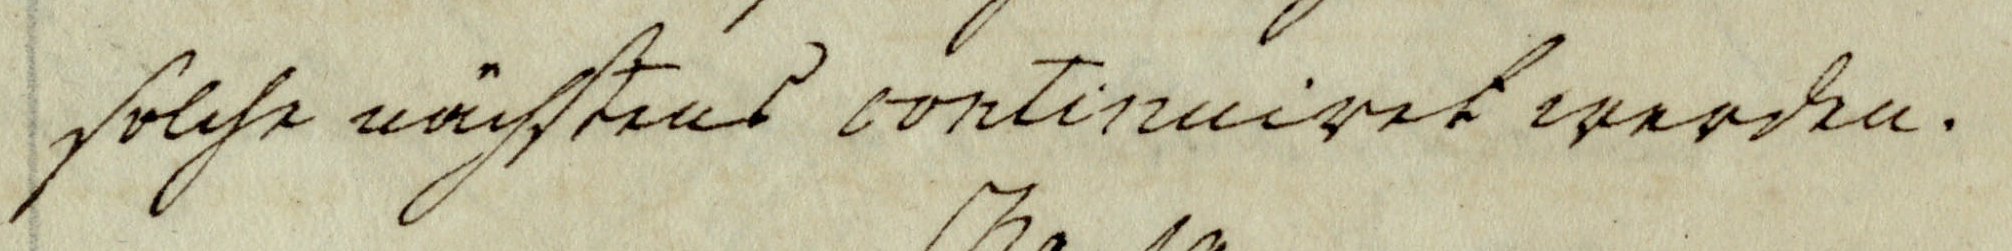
solche nächstens continuiret werden.
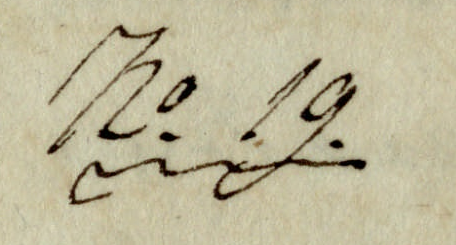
No 19.
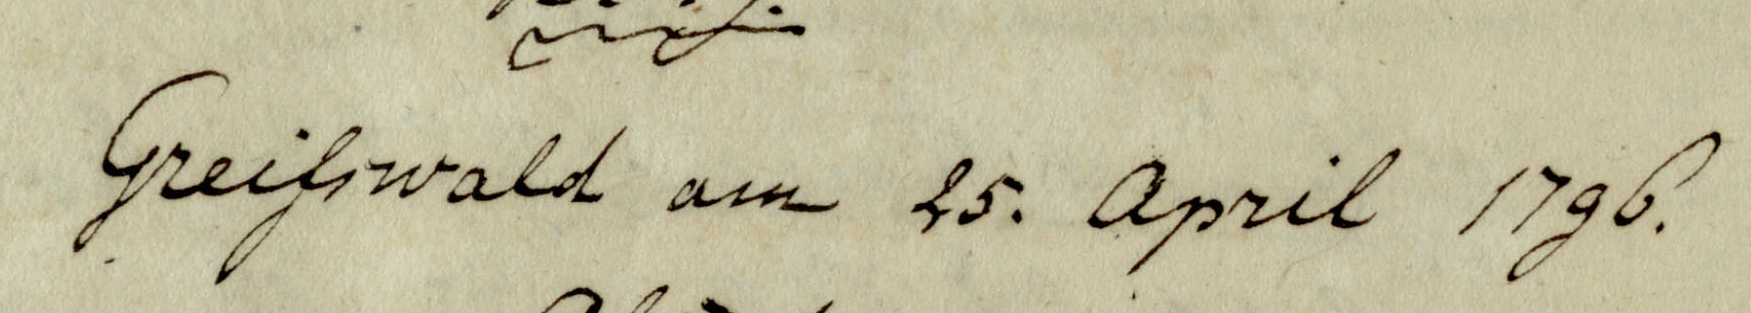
Greifswald am 25. April 1796.
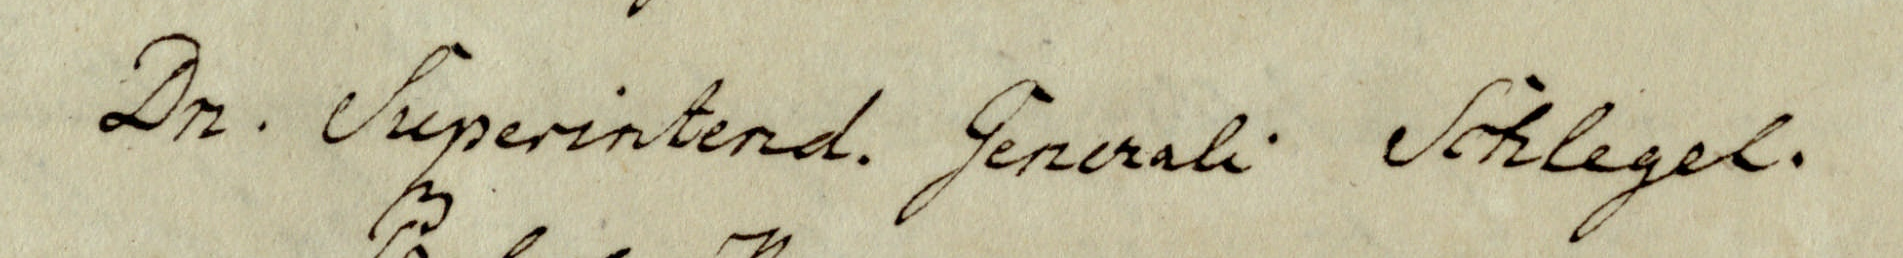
Dn. Superintend. Generali Schlegel.
